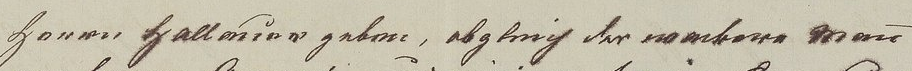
Herrn Hallauer geben , obgleich der wackere Mann
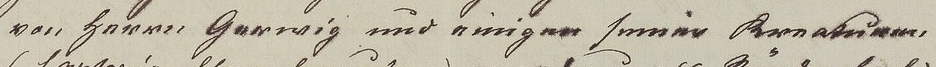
von Herrn Gerwig und einigen seiner Kreaturen
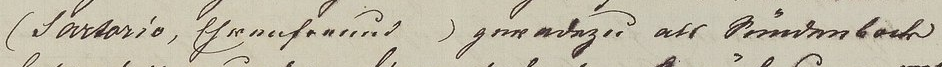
( Sartorio, Ehrenfreund ) geradezu als Sündenbock
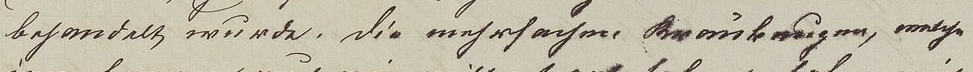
behandelt wurde. Die mehrfachen Kränkungen, welche
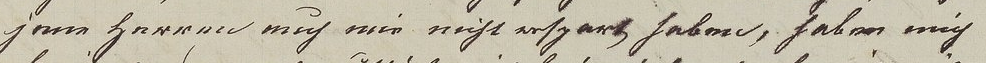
jene Herren auch mir nicht erspart haben, haben mich
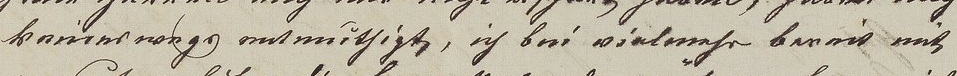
keineswegs entmuthigt, ich bin vielmehr bereit mit
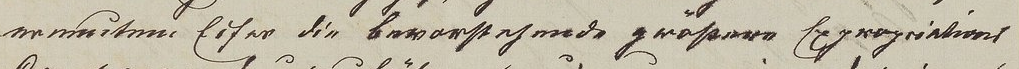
erneutem Eifer die bevorstehende größere Expropriations--
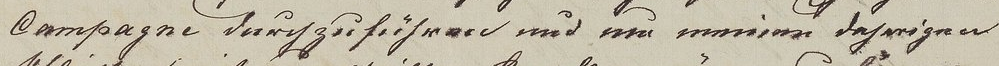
Campagne durchzuführen und um meinen daherigen
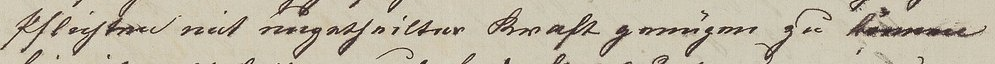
Pflichten mit ungetheilter Kraft genügen zu können
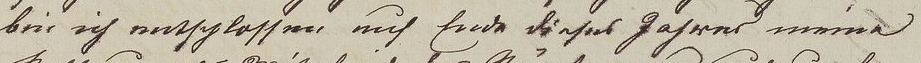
bin ich entschlossen auf Ende dieses Jahres meine
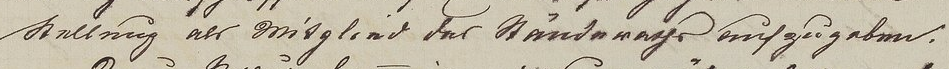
Stellung als Mitglied des Ständeraths aufzugeben.
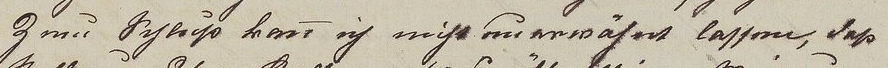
Zum Schluß kann ich nicht unerwähnt lassen, daß
